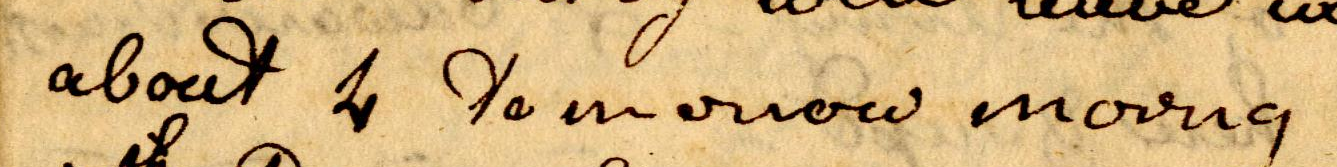about 4 to mmrow morng
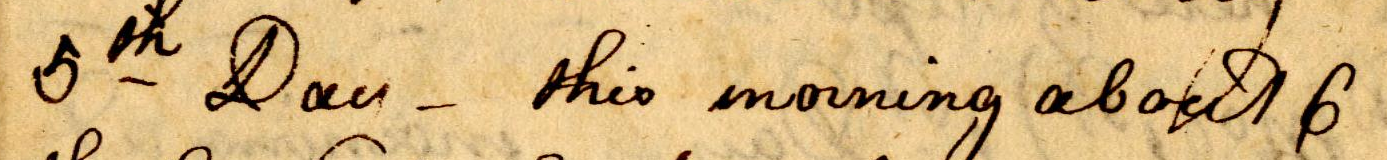5^th Day- this morning about 6
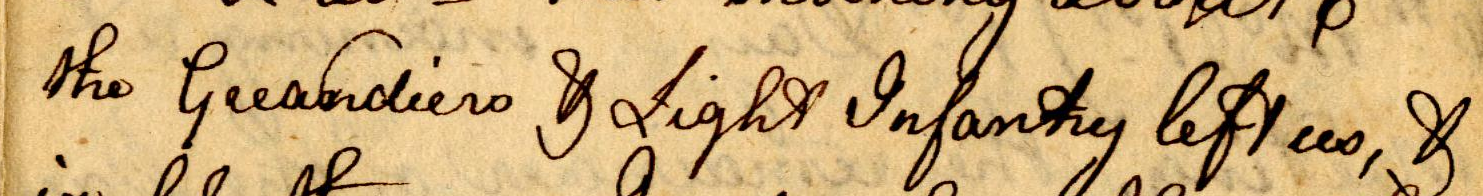the Greandiers & Light Infantry left us, &
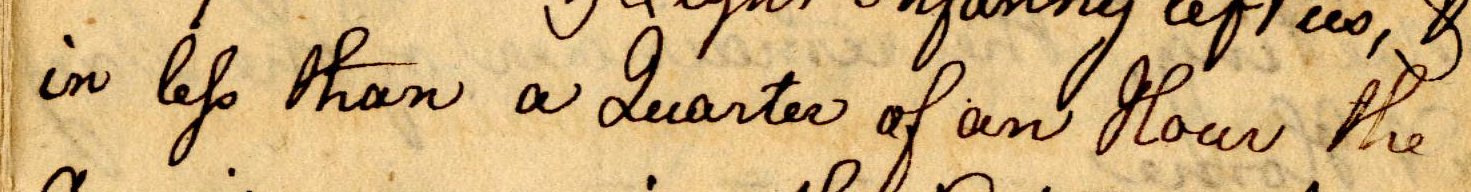in less than a Quarter of an Hour the
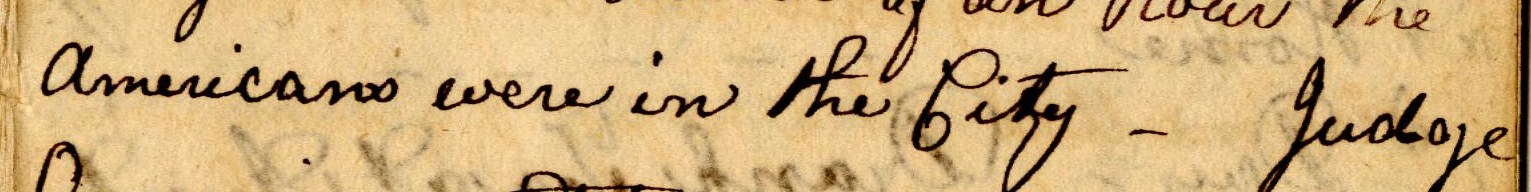Americans were in the City- Judge
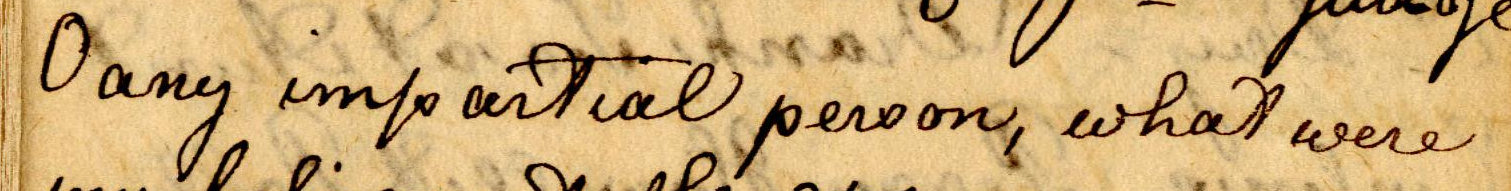Dany impartial person, what were
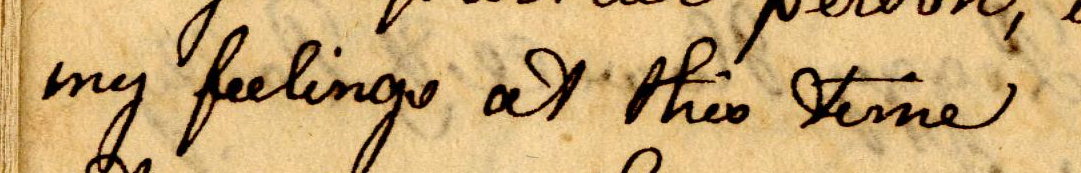my feelings at this time
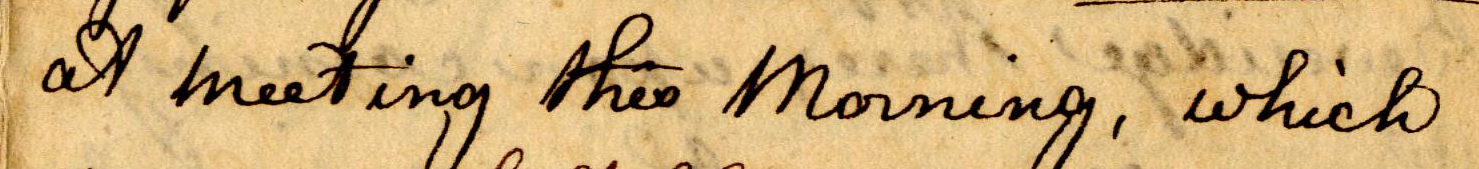at Meeting this Morning, which
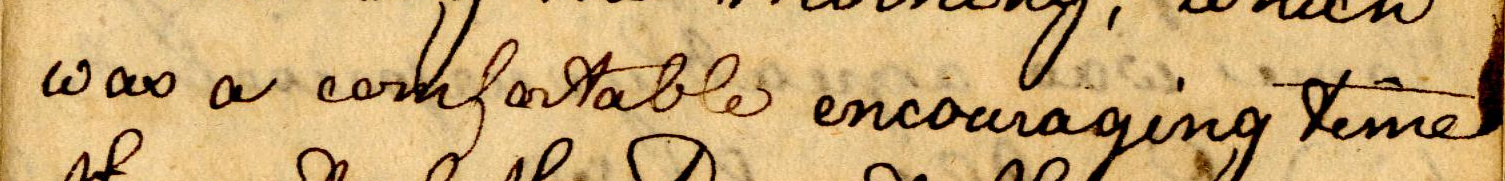was a comfortable encouraging time
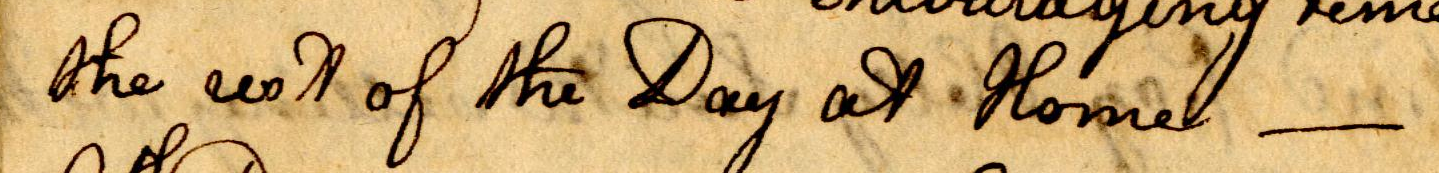the rest of the Day at Home-
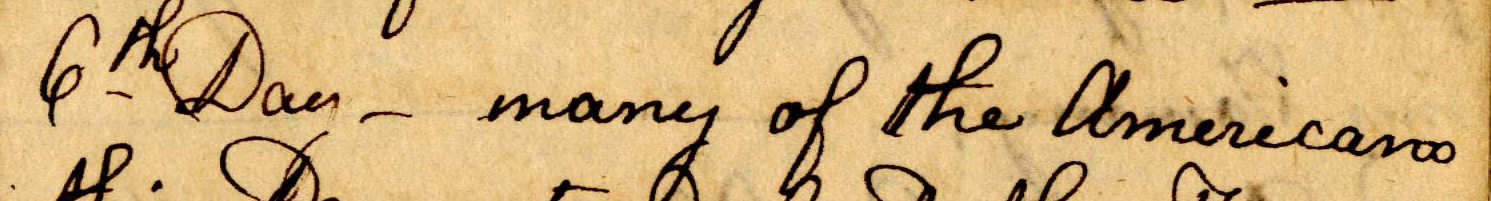6^th Day- many of the Americans
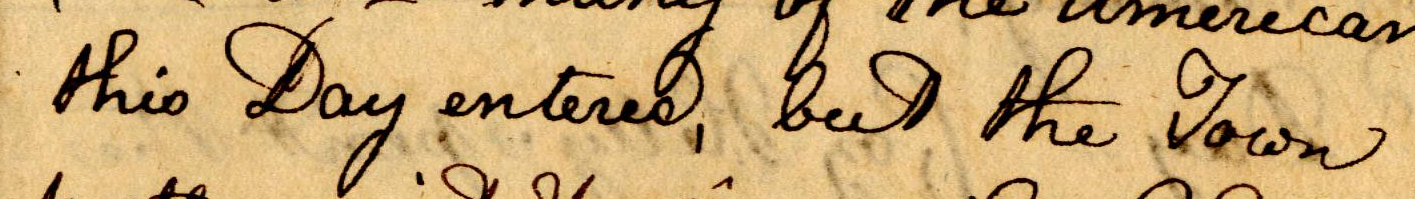this Day entered, but the Town
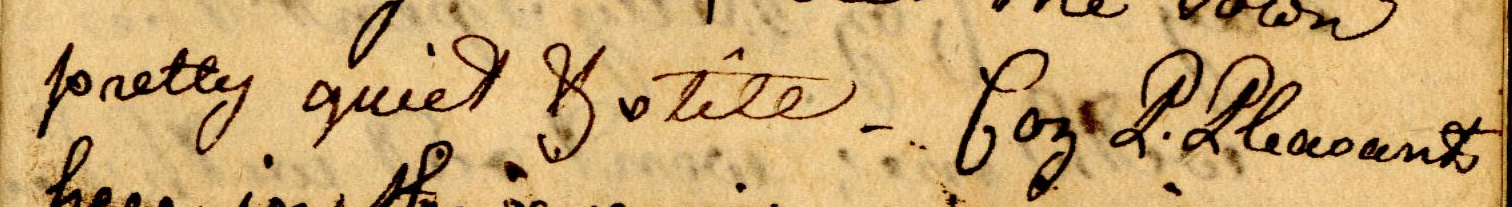pretty quiet & still- Coz P. Pleasants
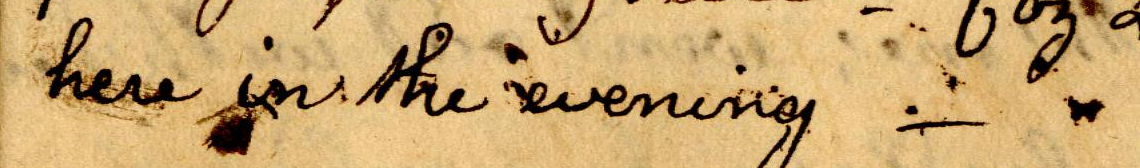here in the evening-
